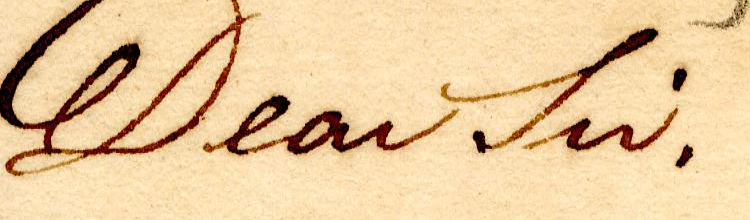Dear Sir,
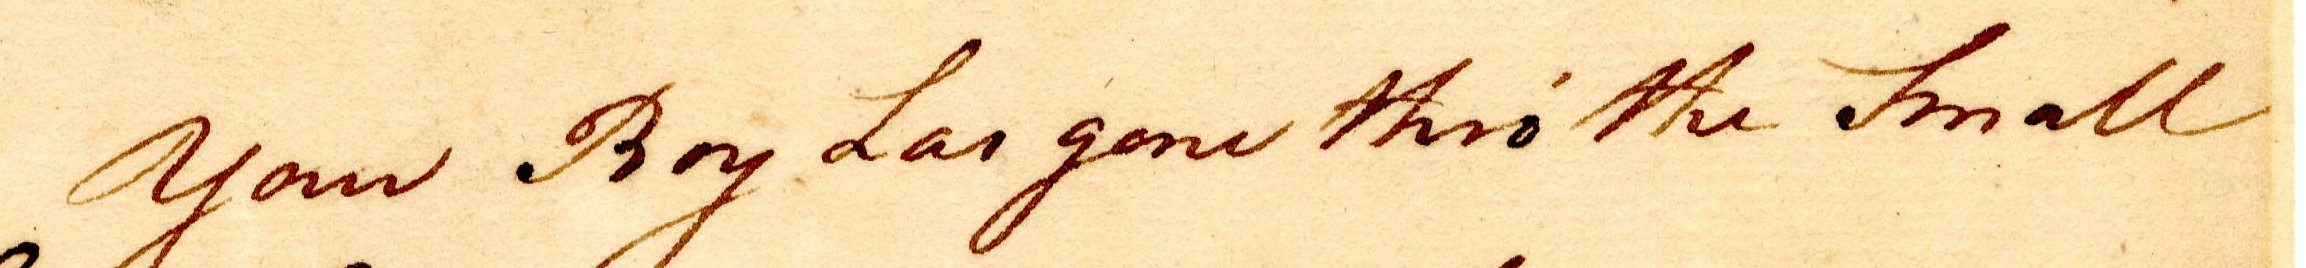Your Boy has gone thro' the Small
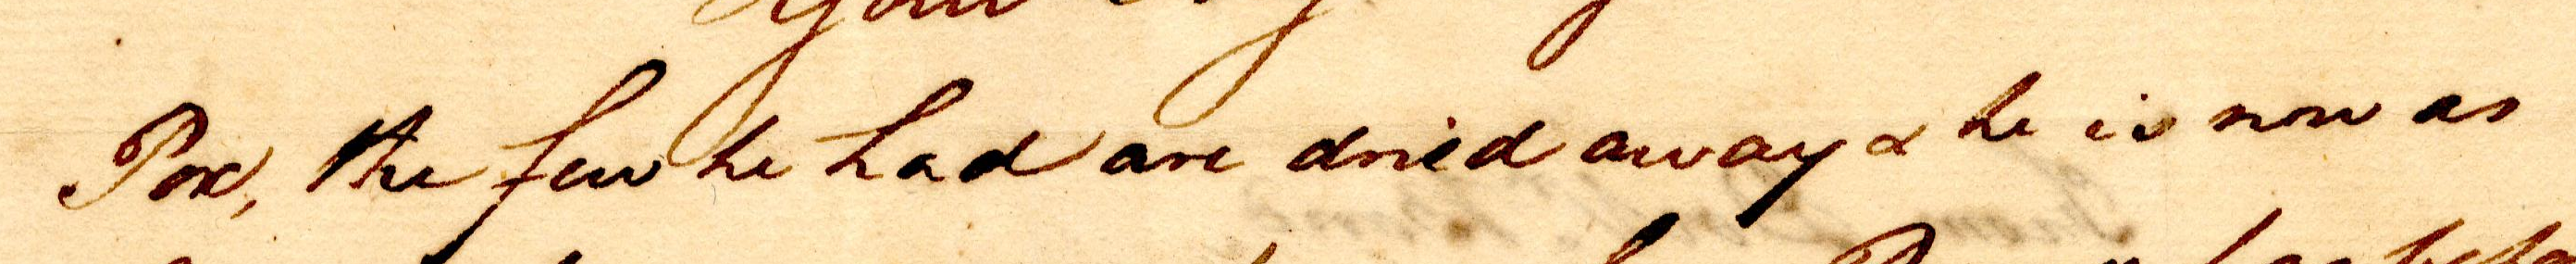Pox, the few he had are dried away & he is now as
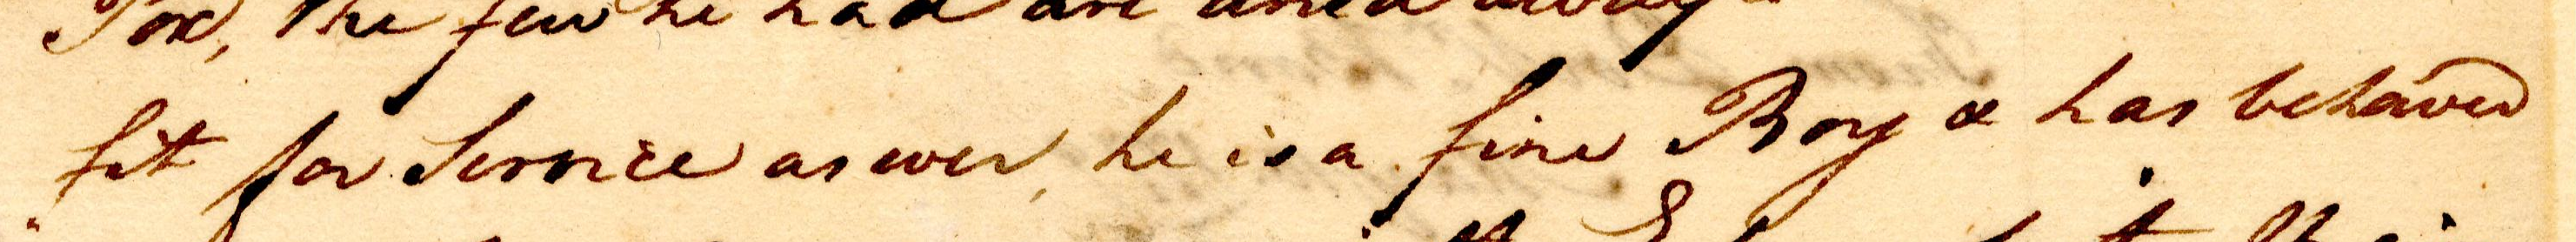fit for Service as ever, he is a fine Boy & has behaved
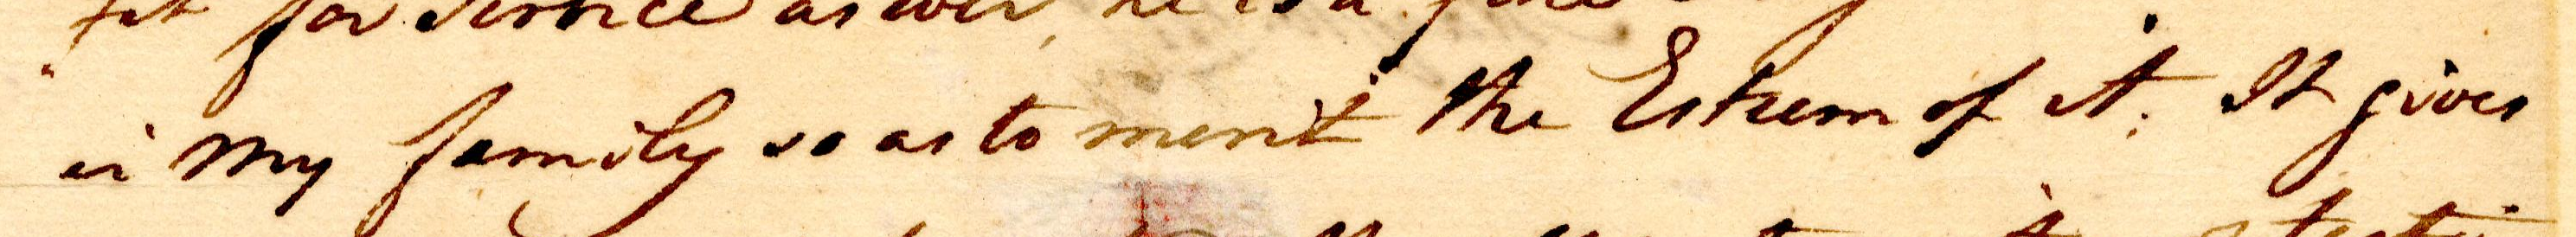in My family so as to merit the Esteem of it. It gives
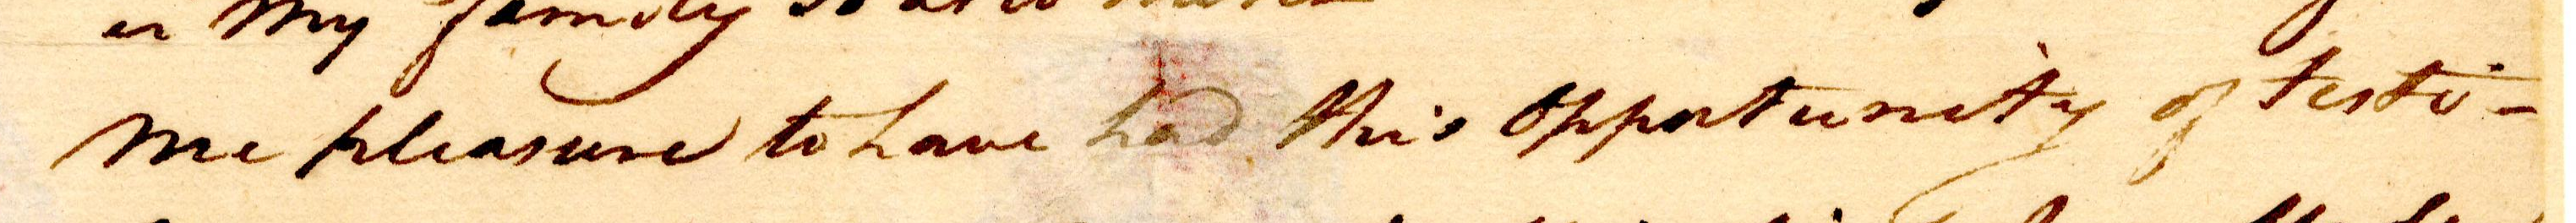me pleasure to have had this opportunity of testi-
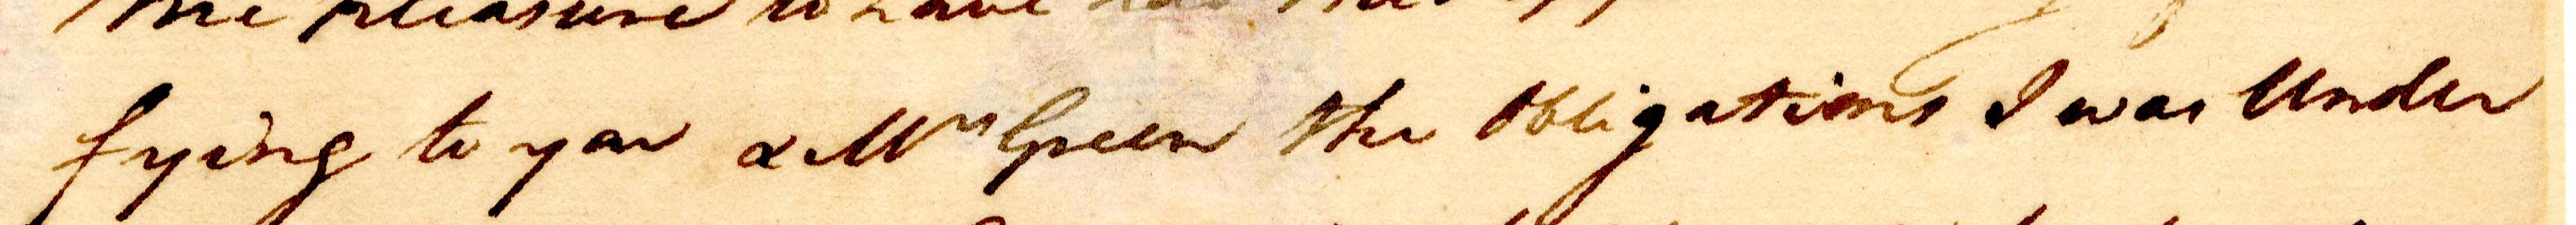fying to you & M^r Green the Obligations I was Under
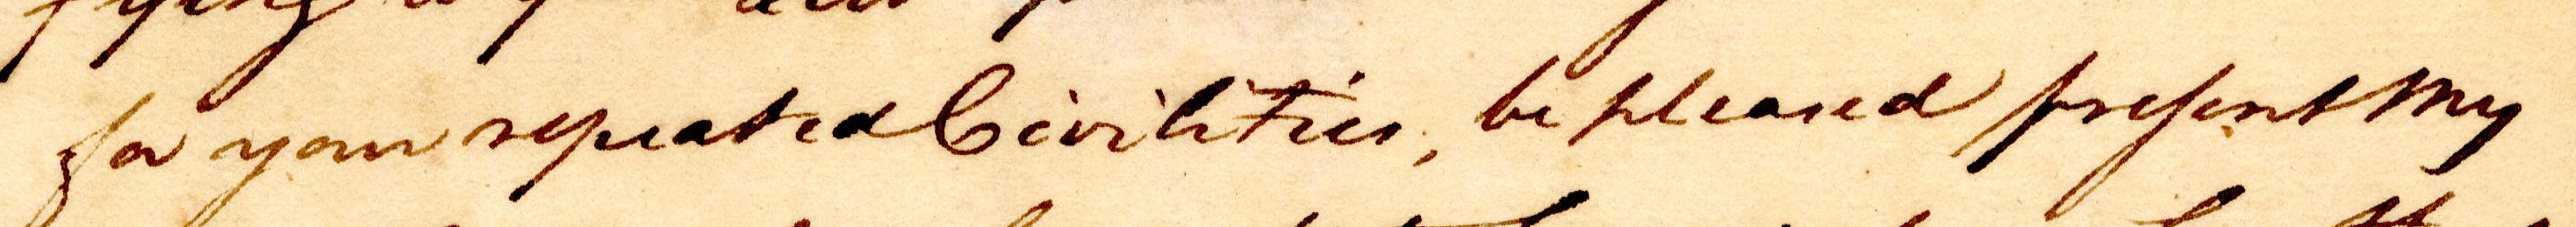for your requested Civilities, be pleased present my
